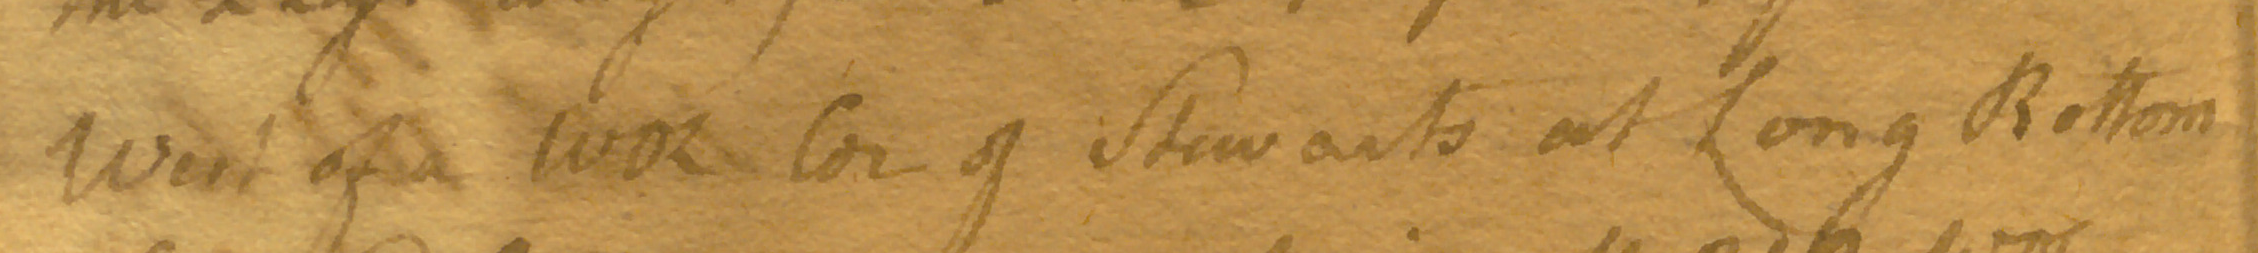West of a W0h Cor of Stewarts at Long Bottom
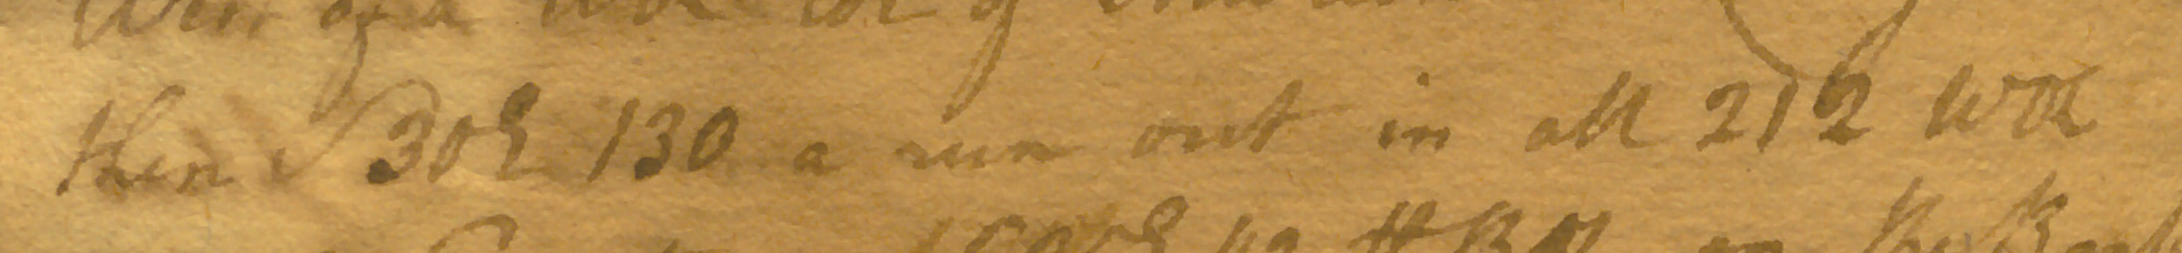then S30E 130 a run out in all 212 W0h
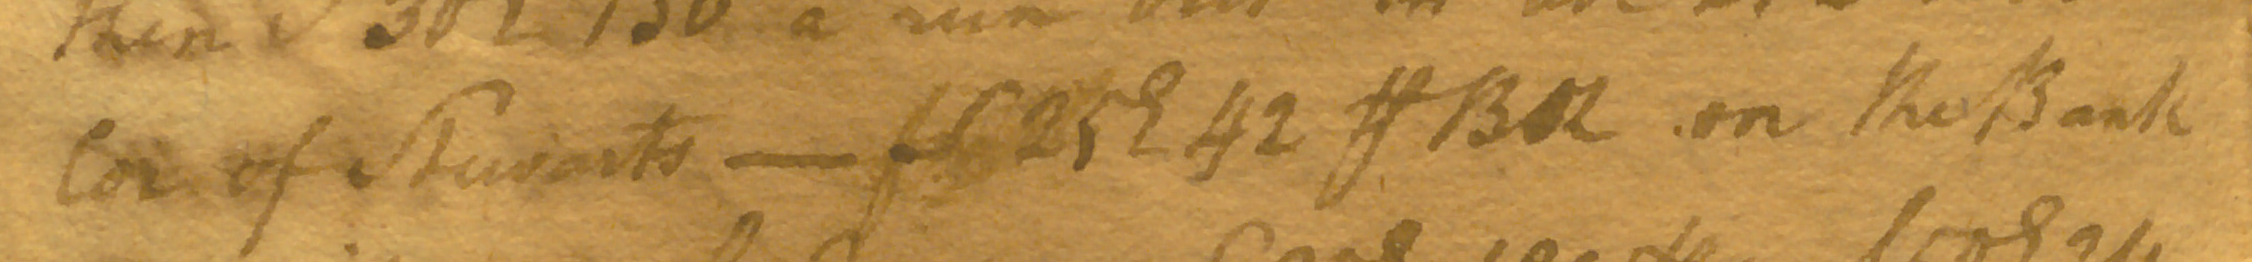cor of Stewarts- S25E42 per B0h on the Bank
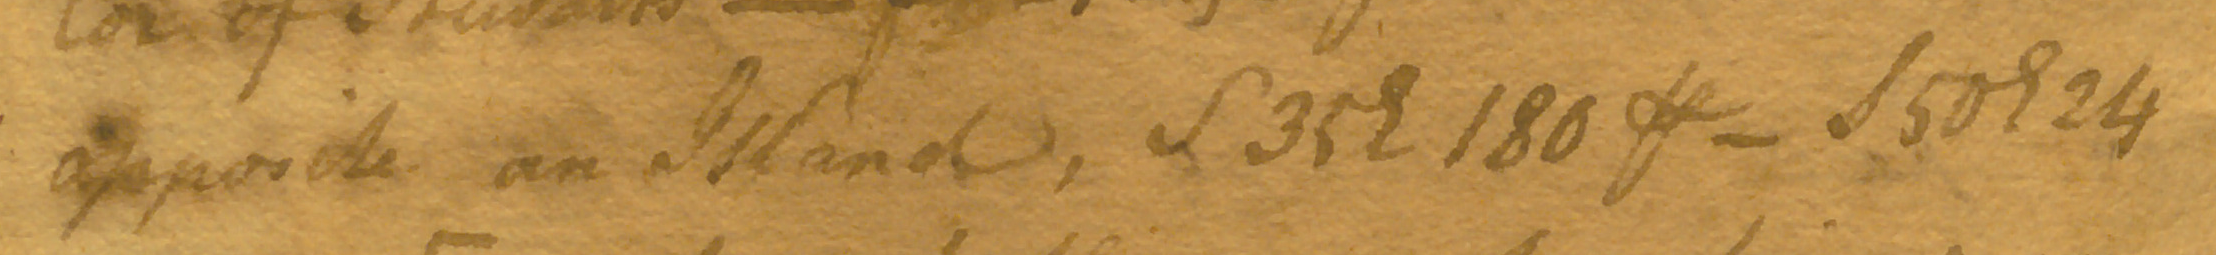opposite an Island, S35E 180 per - S50E24
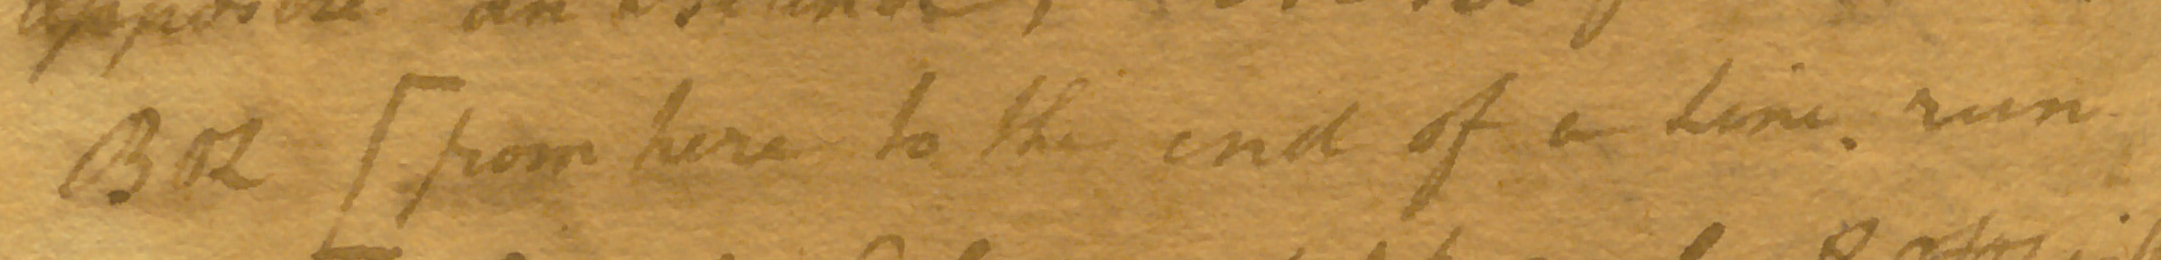B0h (from here to the end of a Line run
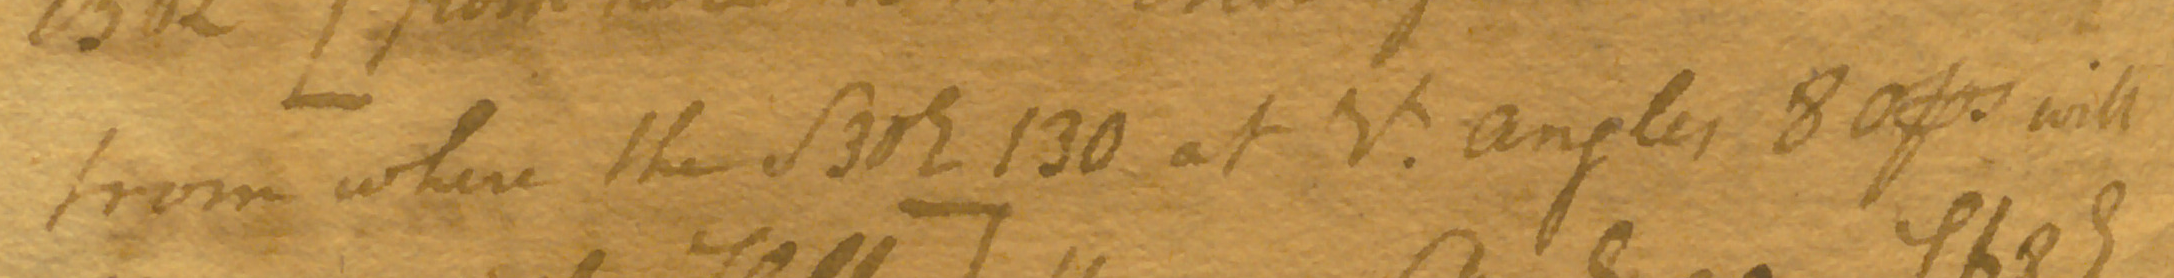from where the S30E 130 at r^t. angles 80 per will
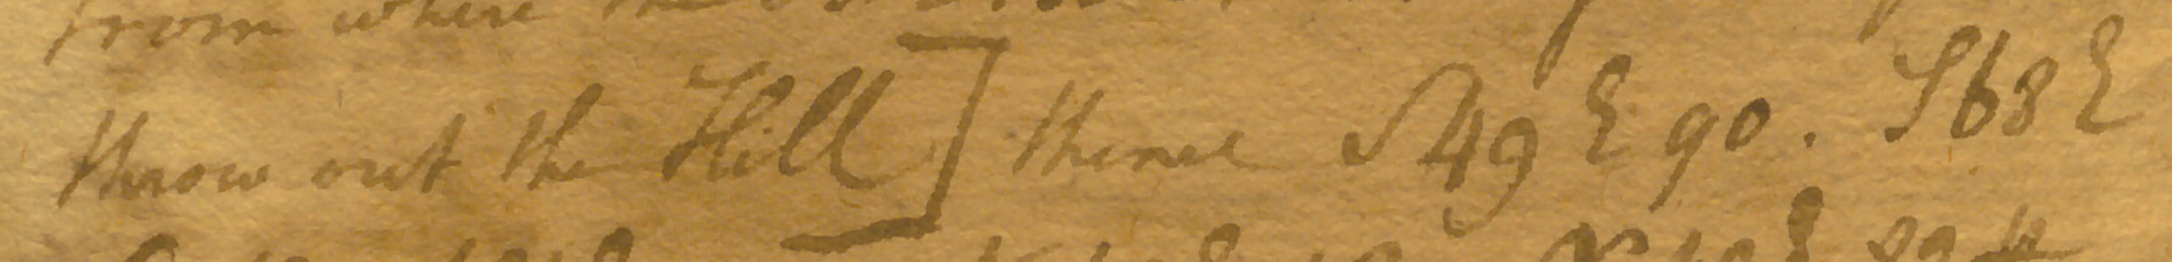throw out the Hill) thence S49E90. S68E
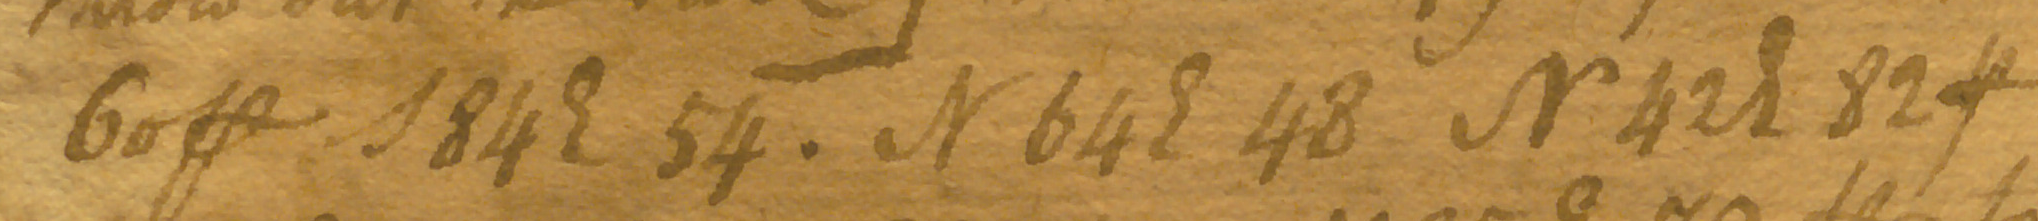60 per S84E 54. N 64E 48 N42E 82 per
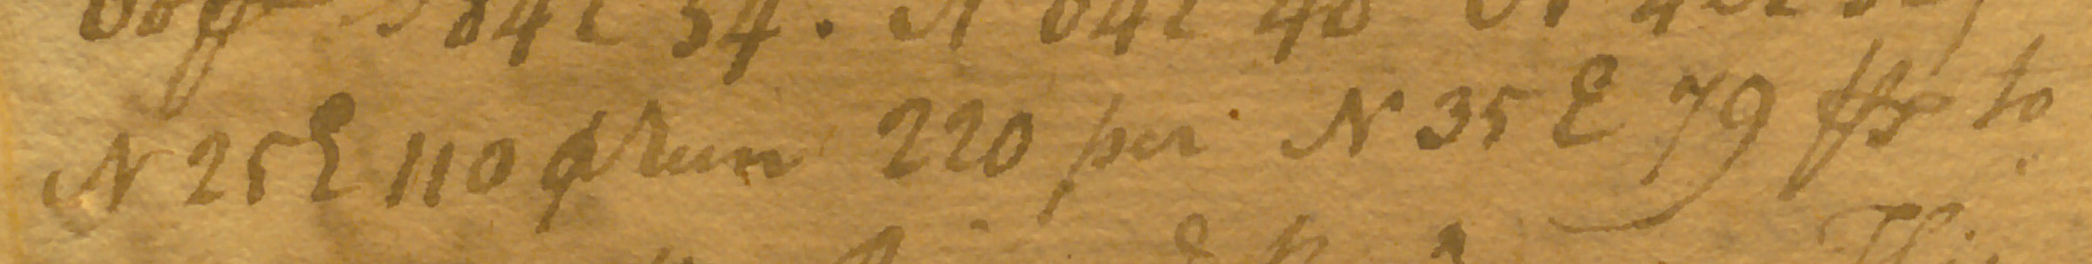N25E 110 run 220 per N35 e 79 per to
